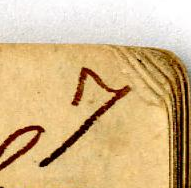7
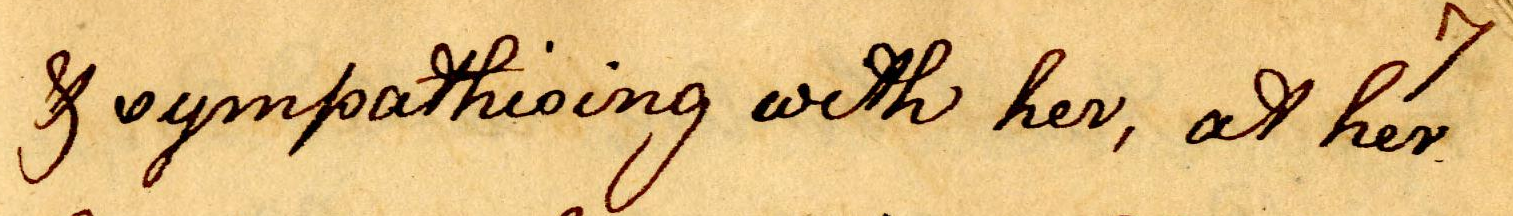& sympathising with her, at her
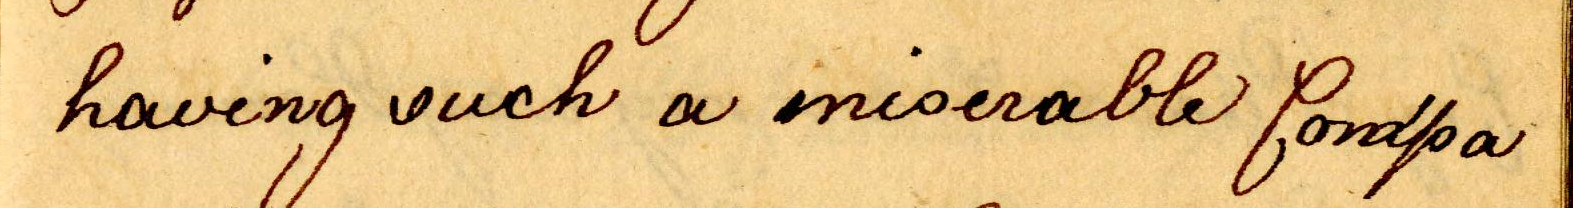having such a miserable Compa
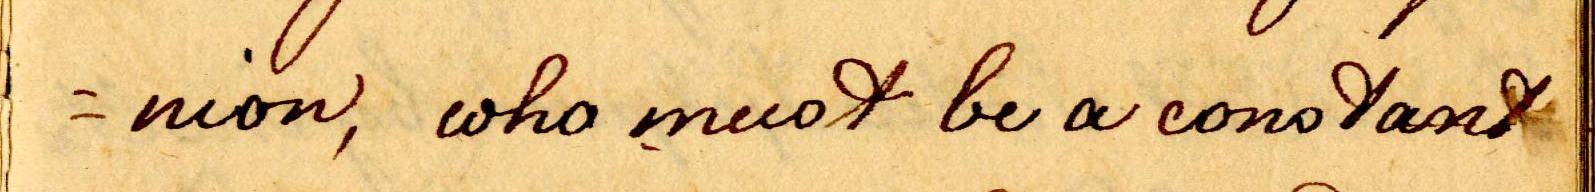-nion, who must be a constant
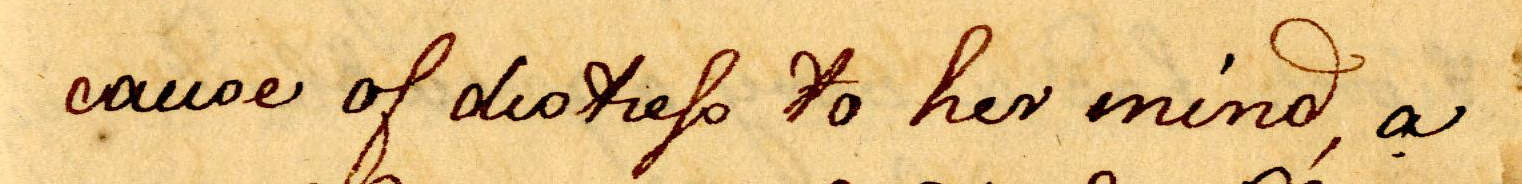cause of distress to her mind, a
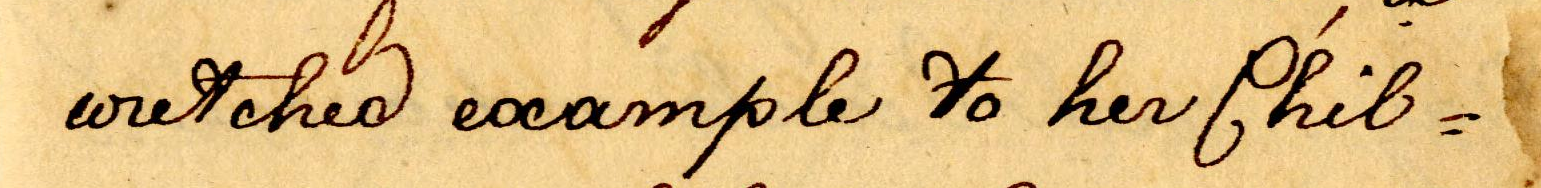wretched example to her Chil-
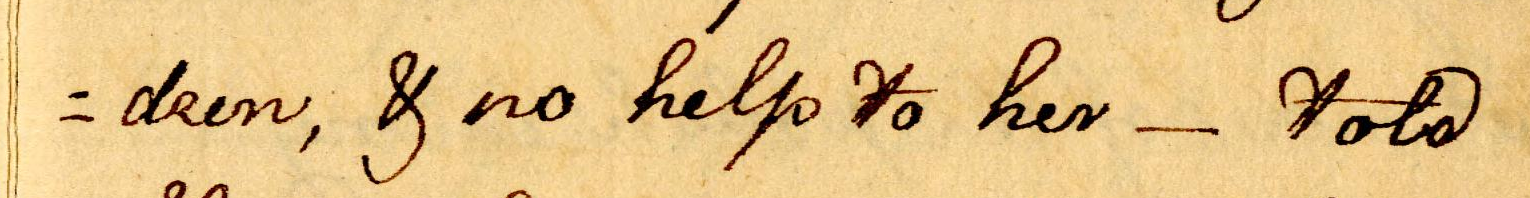-dren, & no help to her- told
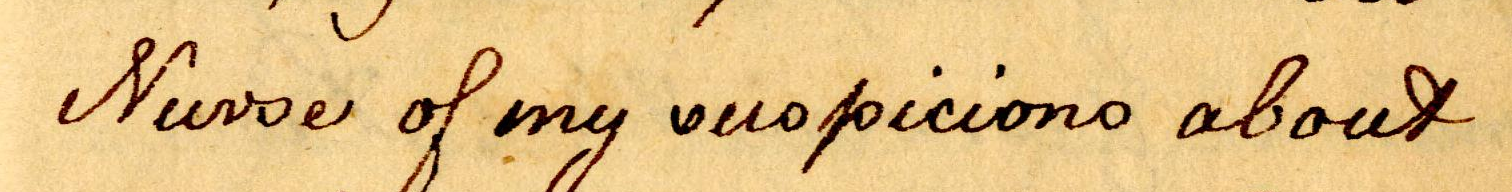Nurse of my suspicions about
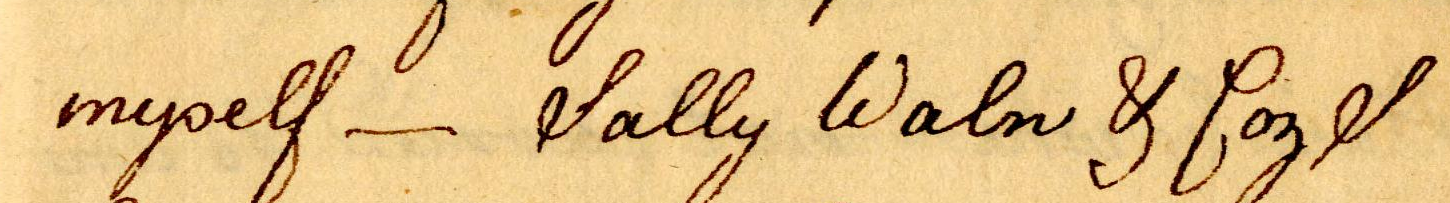myself- Sally Waln & Coz S
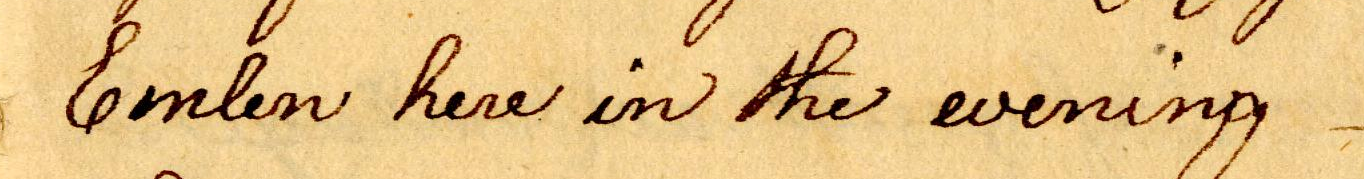Emlen here in the evening
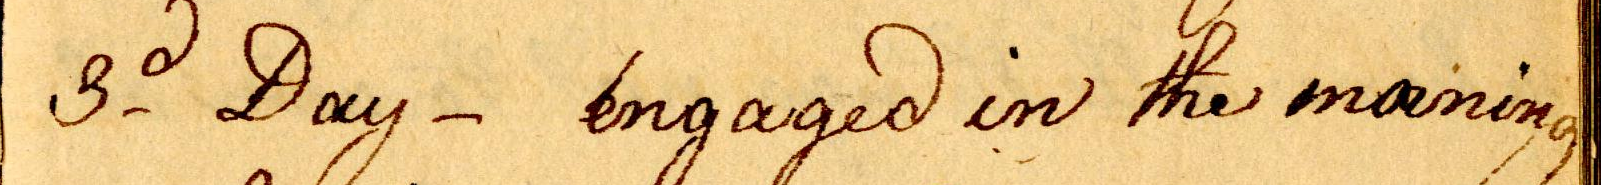3^d Day- engaged in the morning
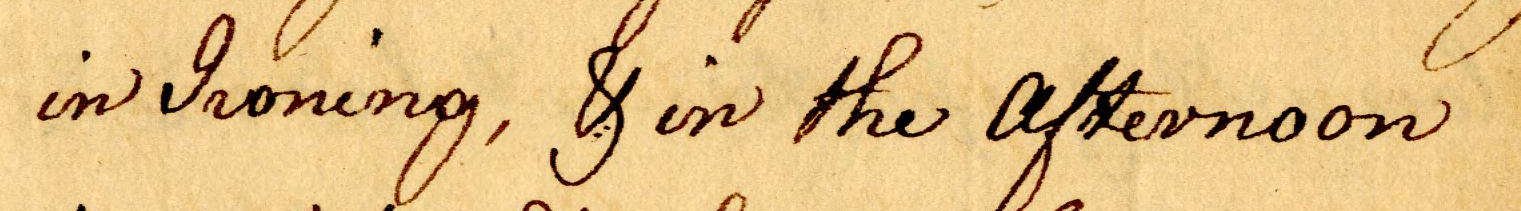in Ironing, & in the Afternoon
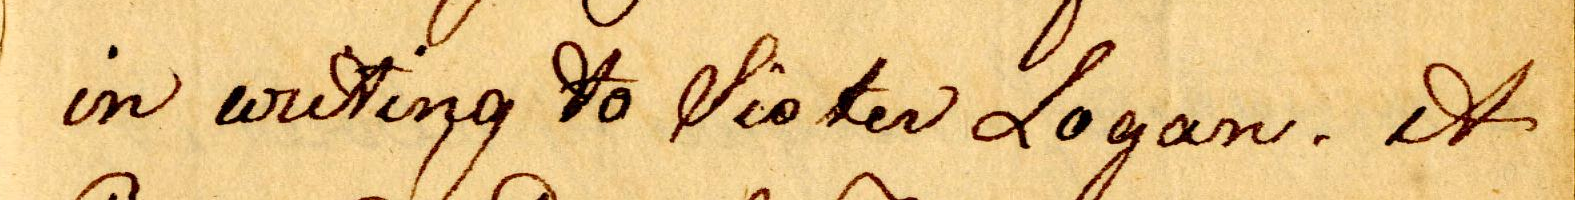in writing to Sister Logan. A
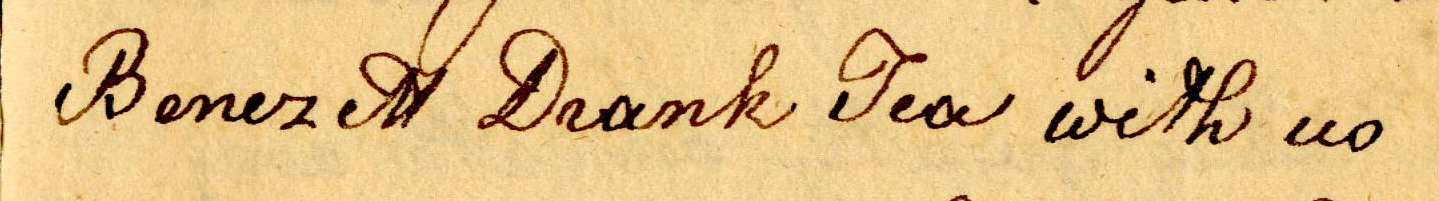Benezett Drank Tea with us
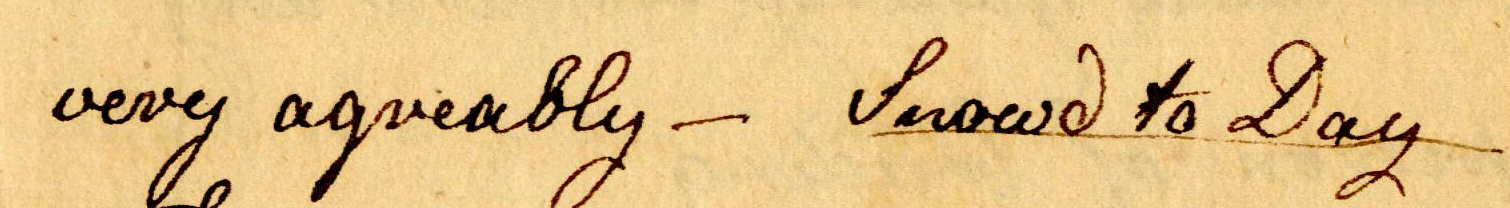very agreably- Snowd to Day-
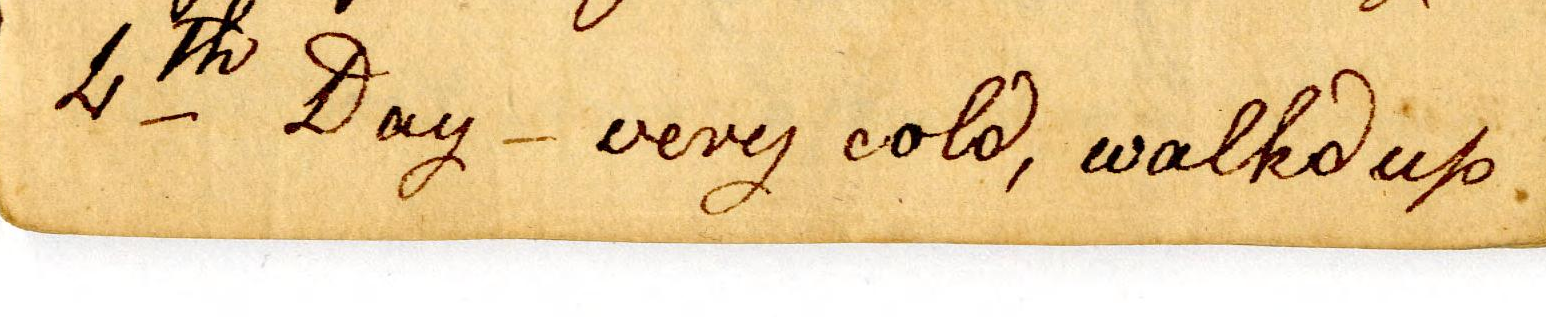4^th Day- very cold, walkd up
